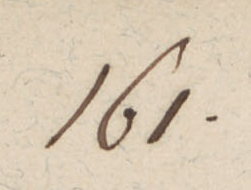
161.
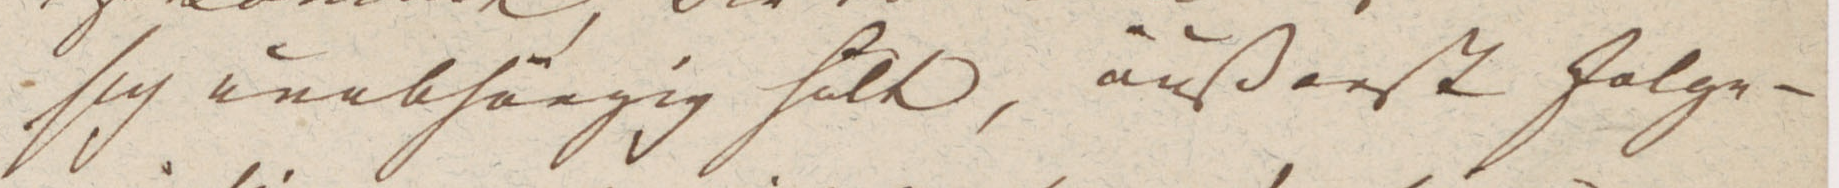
sich unabhängig hält, äusserst folge-
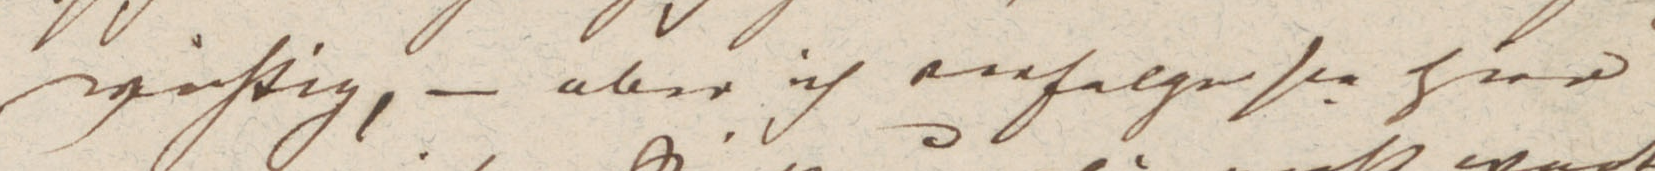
wichtig, – aber ich verfolge sie hier
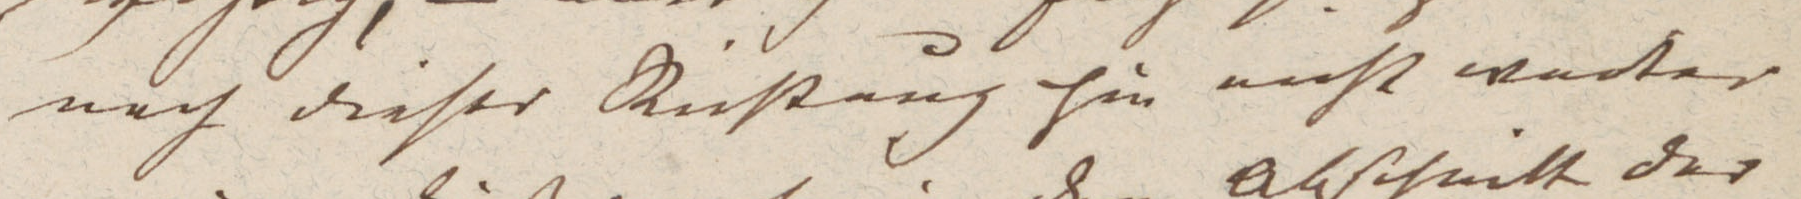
nach dieser Richtung hin nicht weiter
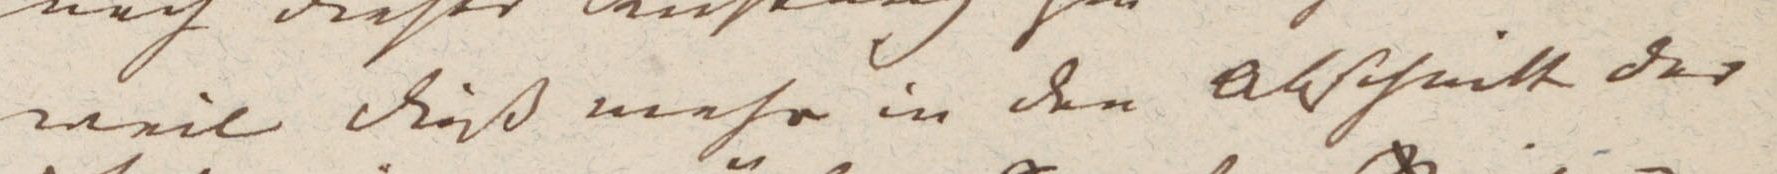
weil diess mehr in den Abschnitt der
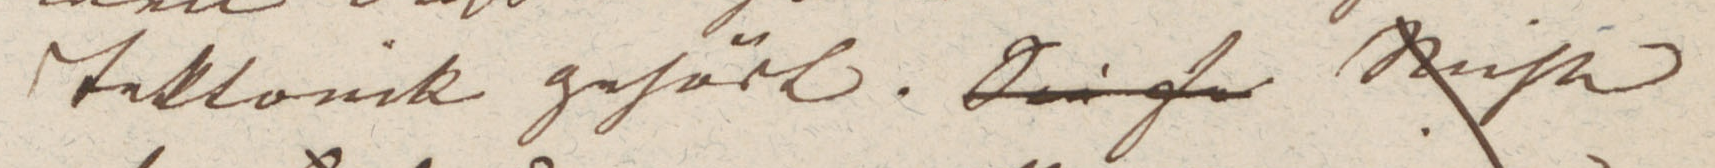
Tektonik gehört. Sie f Nicht
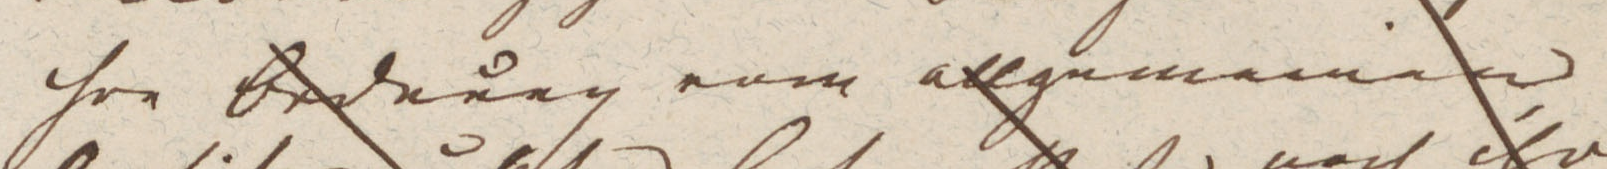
ihre Ordnung vom allgemeinen
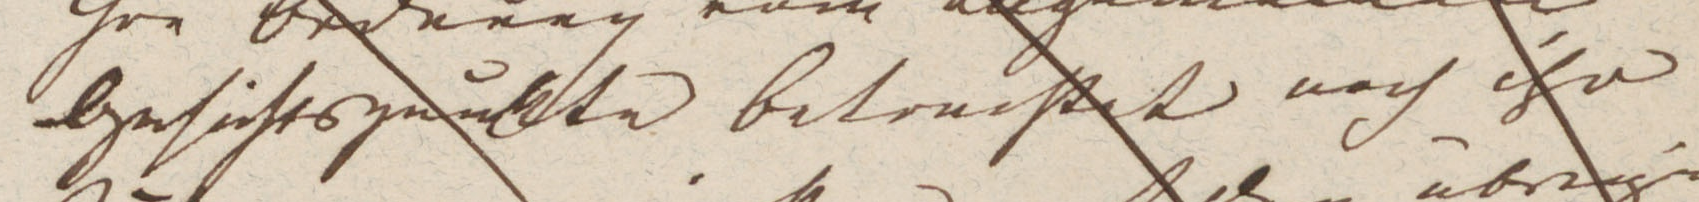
Gesichtspunkte betrachtet noch ihr
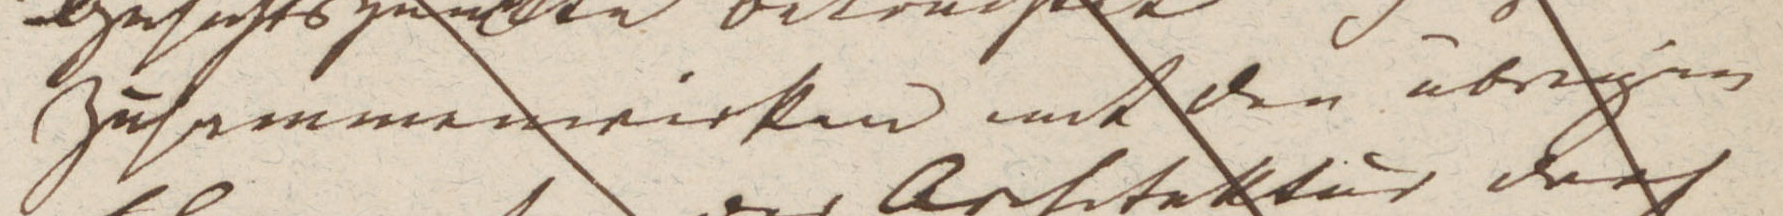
Zusammenwirken mit den übrigen
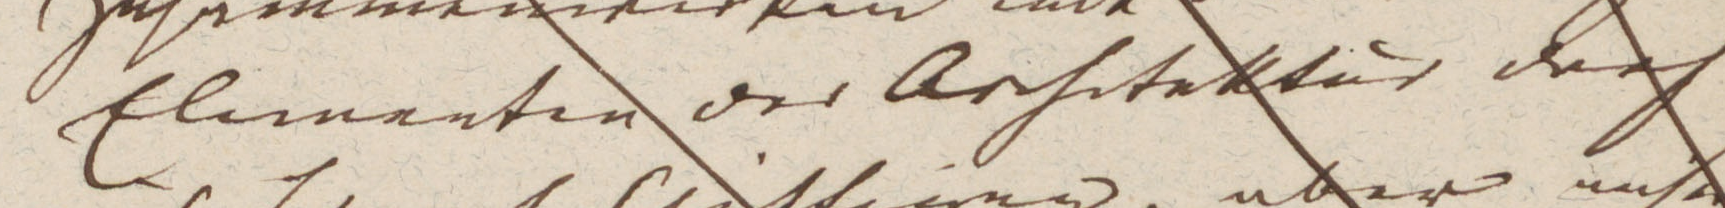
Elementen der Architektur darf
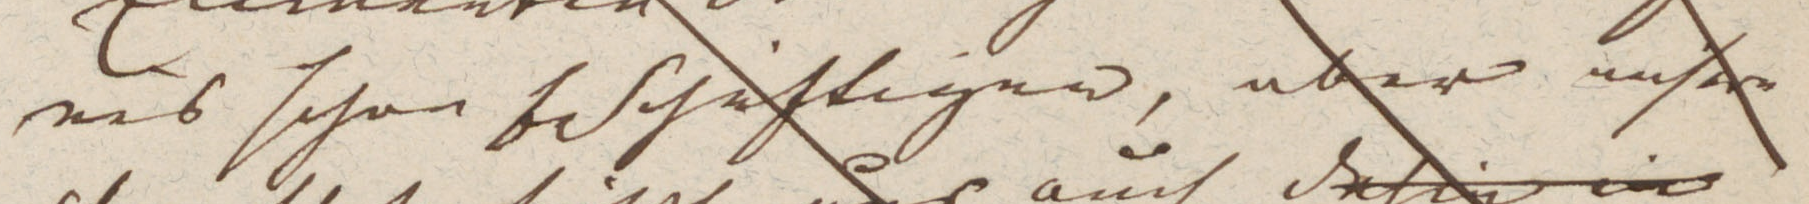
uns schon beschäftigen, aber unsere
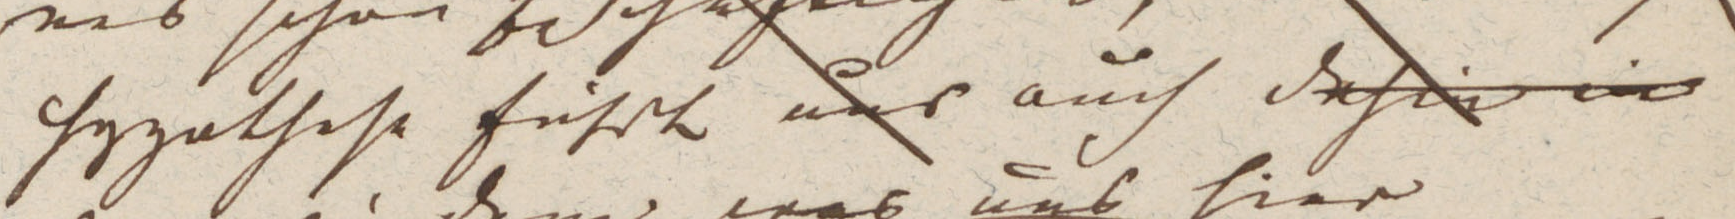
Hypothese führt uns auch dahin in
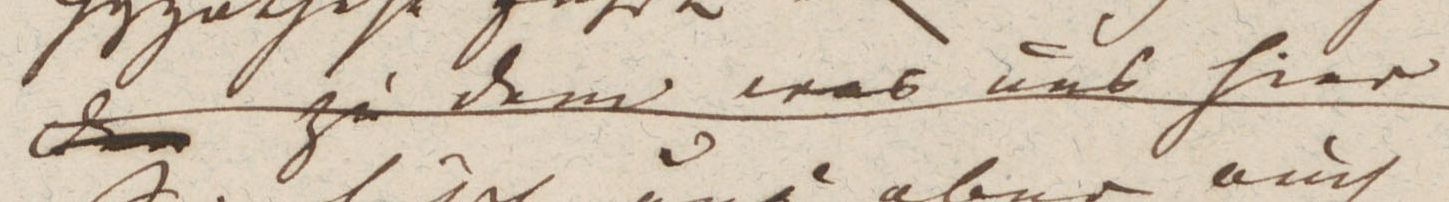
den zu dem was uns hier
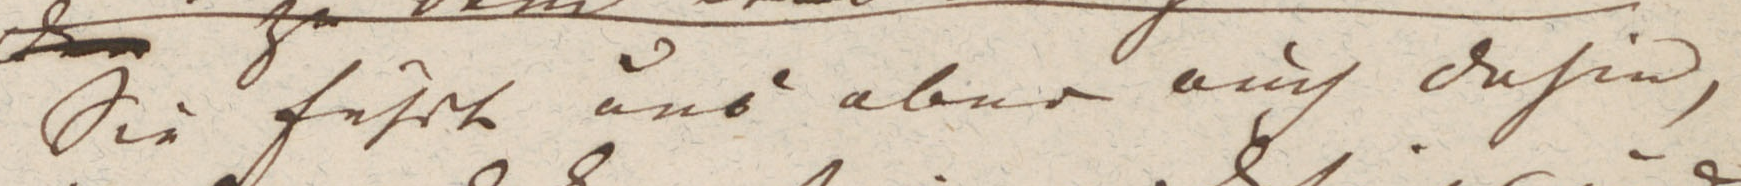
Sie führt uns aber auch dahin,
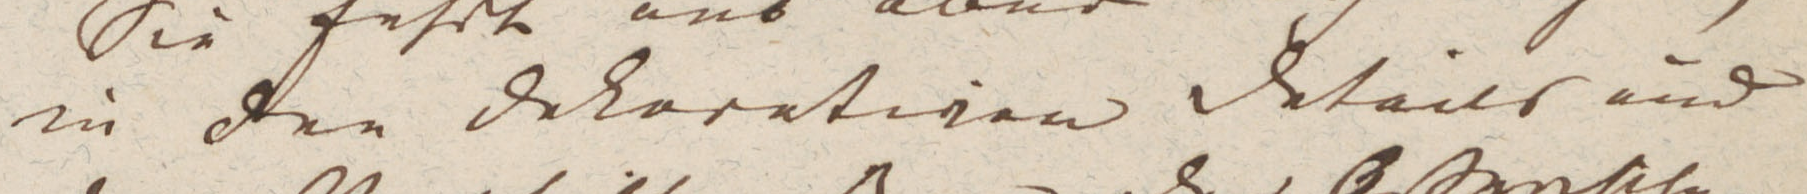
in den dekorativen Details und
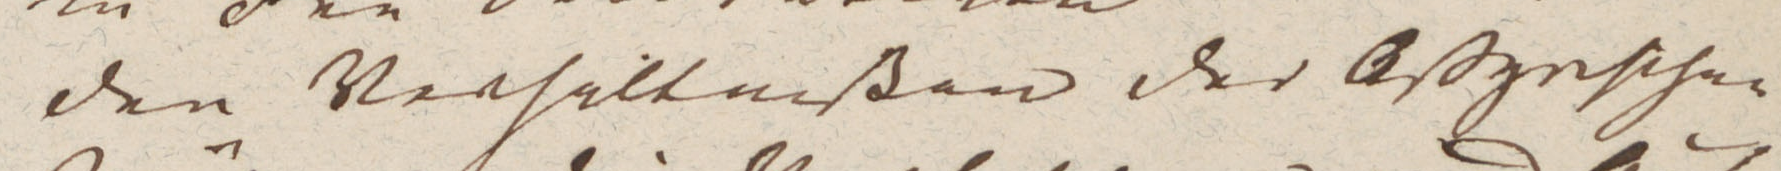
den Verhältnissen der Assyrischen
